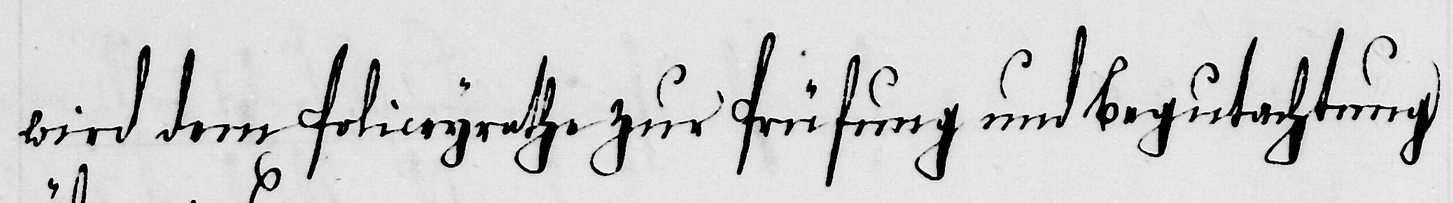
wird dem Policeyrathe zur Prüfung und Begutachtung
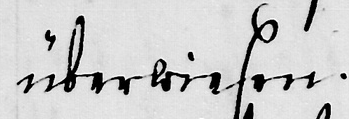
überwiesen.
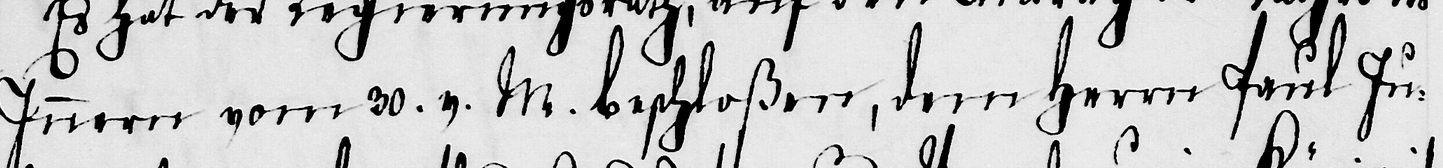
Innern vom 30. v. M. beschloßen, dem Herrn Paul Ju¬
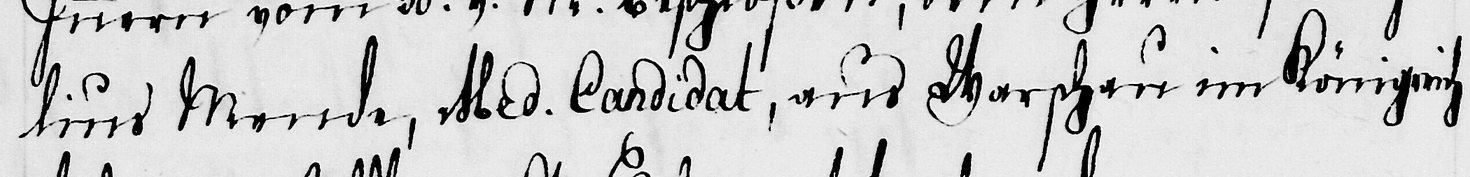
lius Mende, Med. Candidat, aus Warschau im Königreich
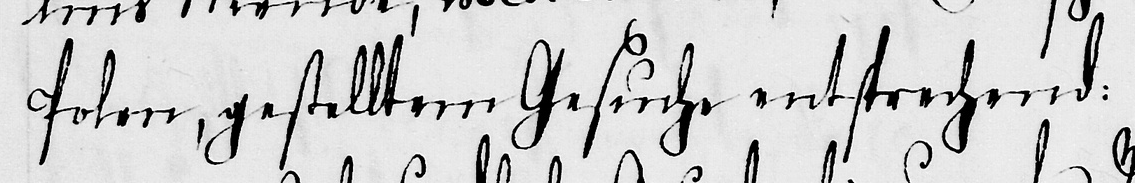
Polen, gestelltem Gesuche entsprechend:
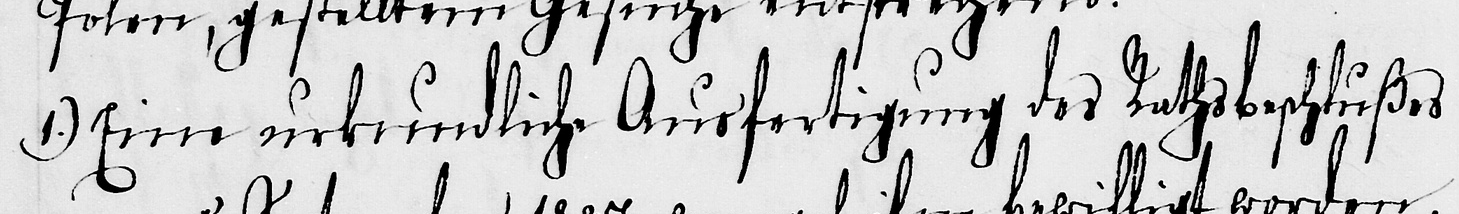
1.) Eine urkundliche Ausfertigung des Rathsbeschlußes
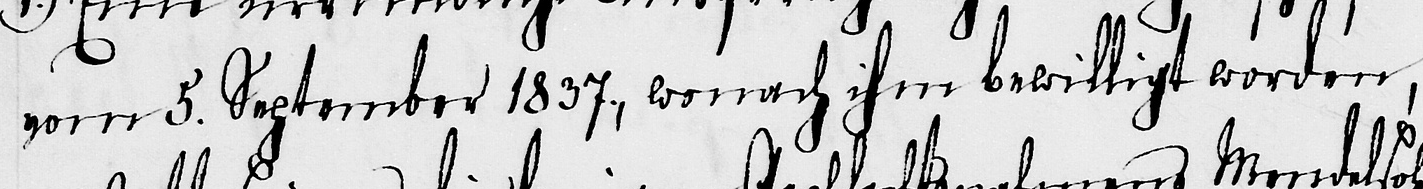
vom 5. September 1837., wonach ihm bewilligt worden,
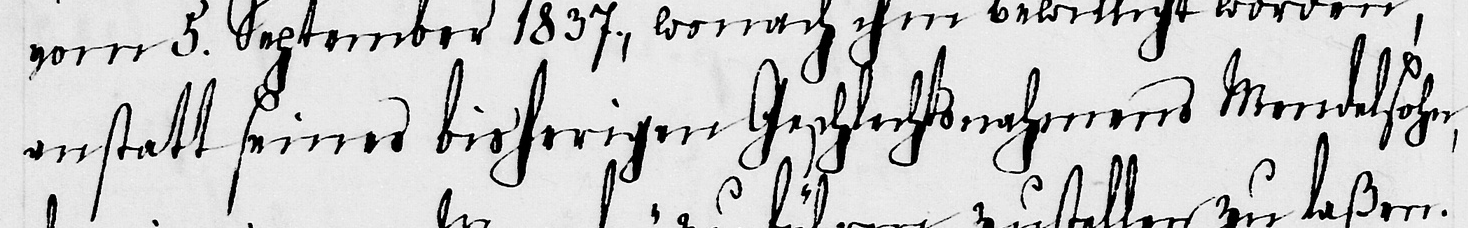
anstatt seines bisherigen Geschlechtsnahmens Mendelsohn,
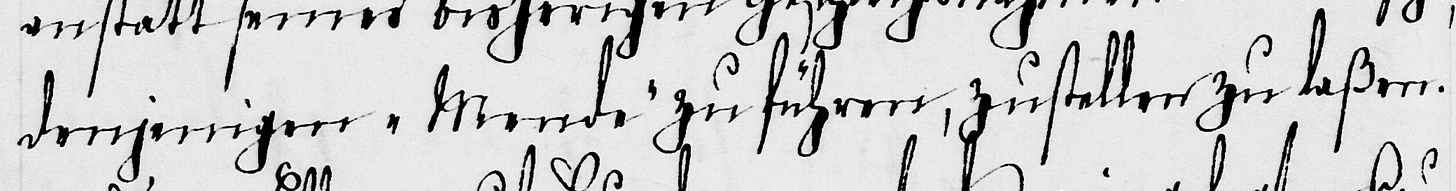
denjenigen „Mende“ zu führen, zustellen zu laßen.
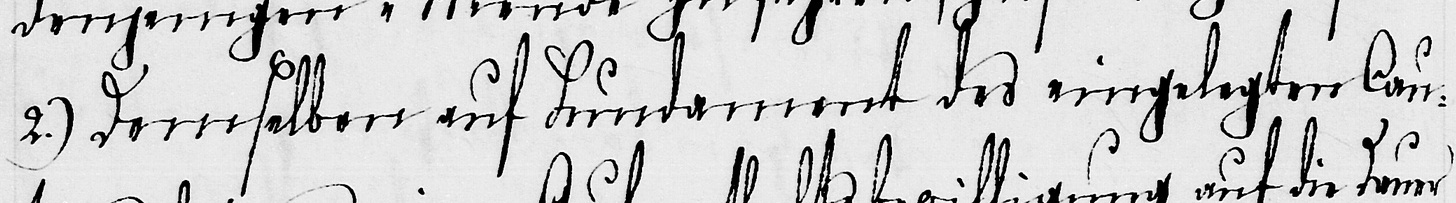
2.) Demselben auf Fundament des eingelegten Cau¬
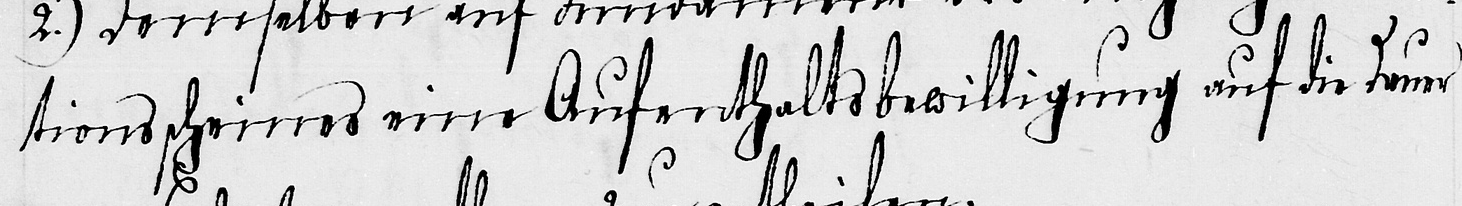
tionsscheines eine Aufenthaltsbewilligung auf die Dauer
